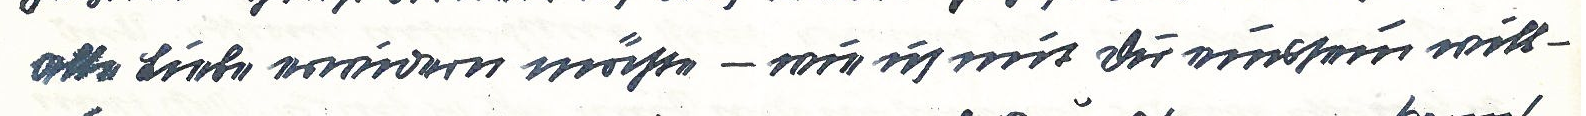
alle Liebe erwidern möchte – wie ich mit Dir einssein will –
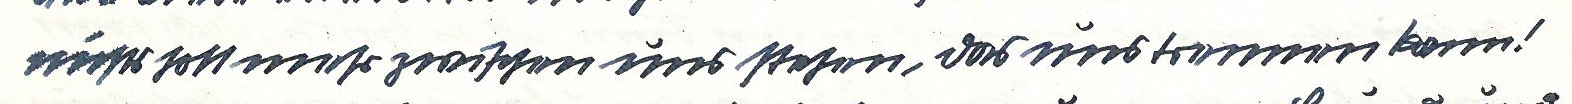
nichts soll mehr zwischen uns stehen, das uns trennen kann!
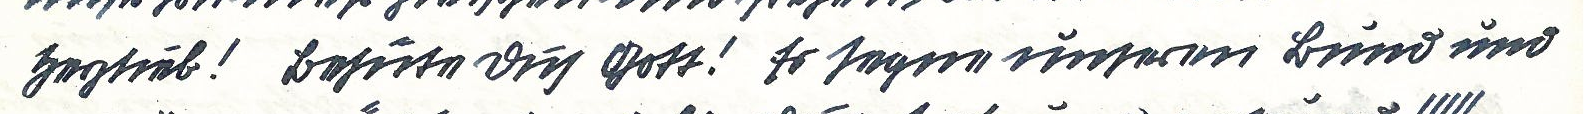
Herzlieb! Behüte Dich Gott! Er segne unseren Bund und
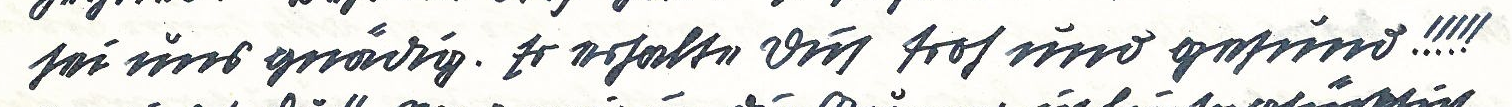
sei uns gnädig. Er erhalte Dich froh und gesund!!!!!
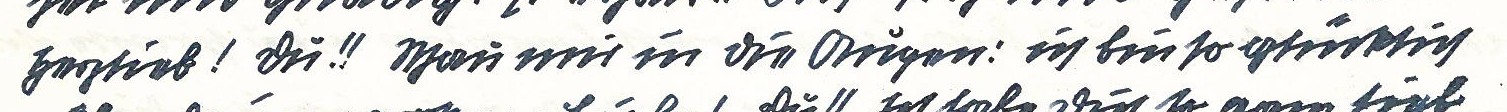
Herzlieb! Du!! Schau mir in die Augen: ich bin so glücklich
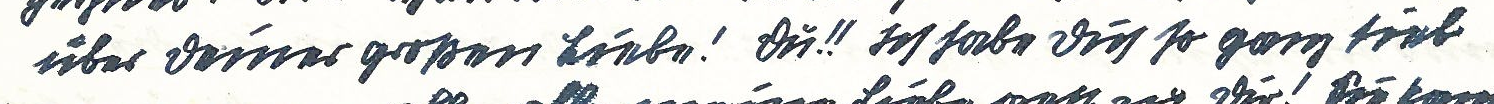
über Deiner großen Liebe! Du!! Ich habe Dich so ganz lieb
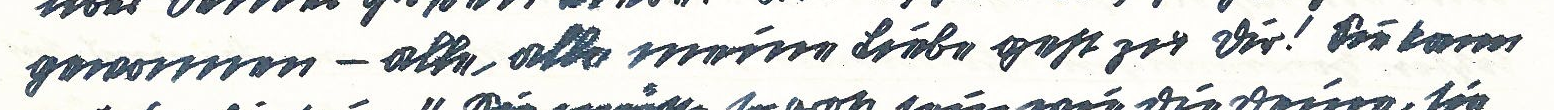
gewonnen – alle, alle meine Liebe geht zu Dir! Sie kann
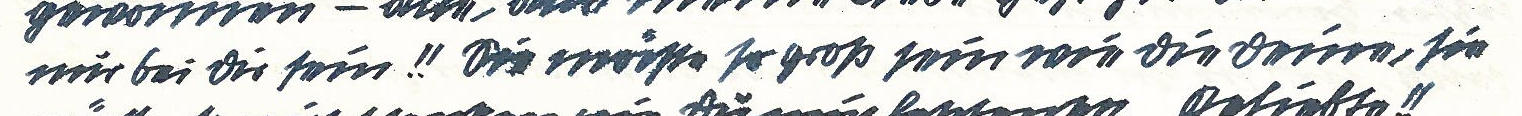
nur bei Dir sein!! Sie möchte so groß sein wie die Deine, sie
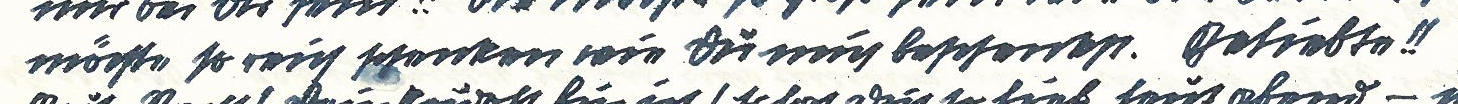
möchte so reich schenken wie Du mich beschenkst. Geliebte!!
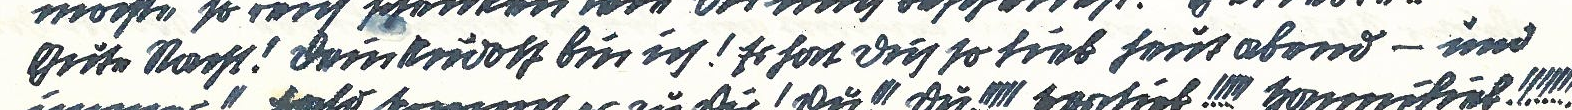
Gute Nacht! Dein Rudolf bin ich! Er hat Dich so lieb heut abend – und
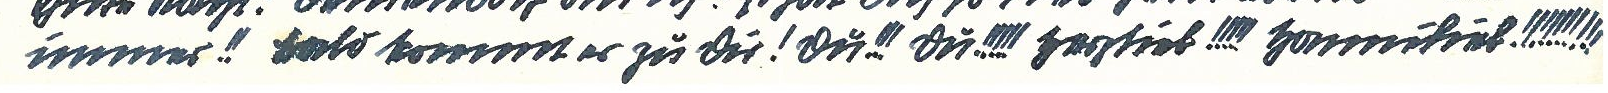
immer!! Bald kommt er zu Dir! Du!!! Du!!!!! Herzlieb!!!!! lieb!!!!!!!!!!
